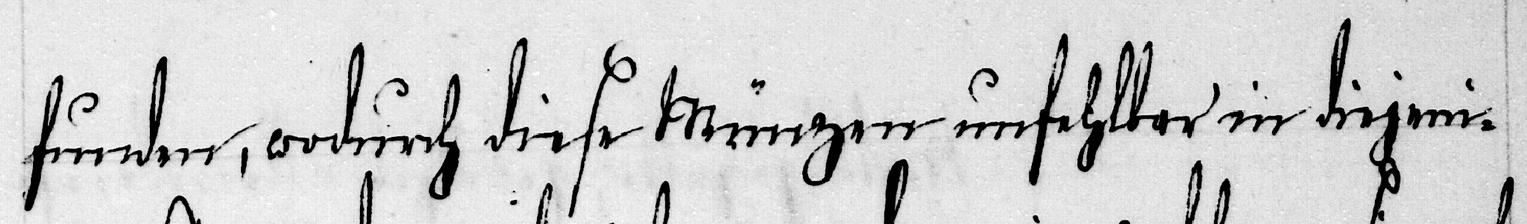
funden wodurch diese Münzen unfehlbar in diejen¬
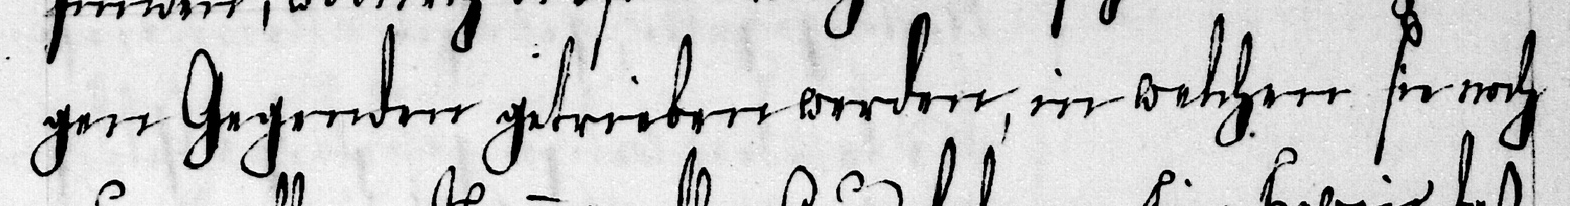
igen Gegenden getrieben werden, in welchen sie noch
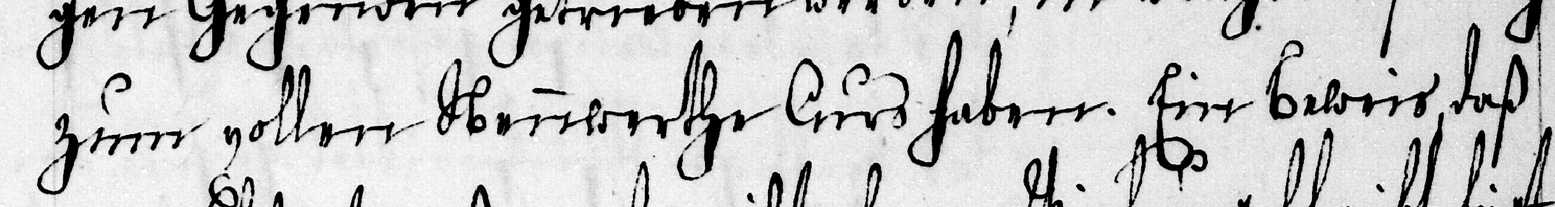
zum vollen Nennwerthe Curs haben. Ein Beweis, daß
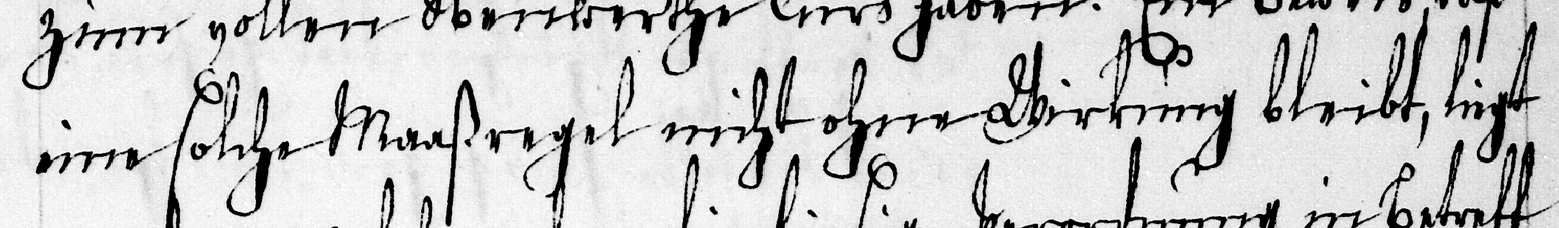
eine solche Maaßregel nicht ohne Wirkung bleibt, liegt
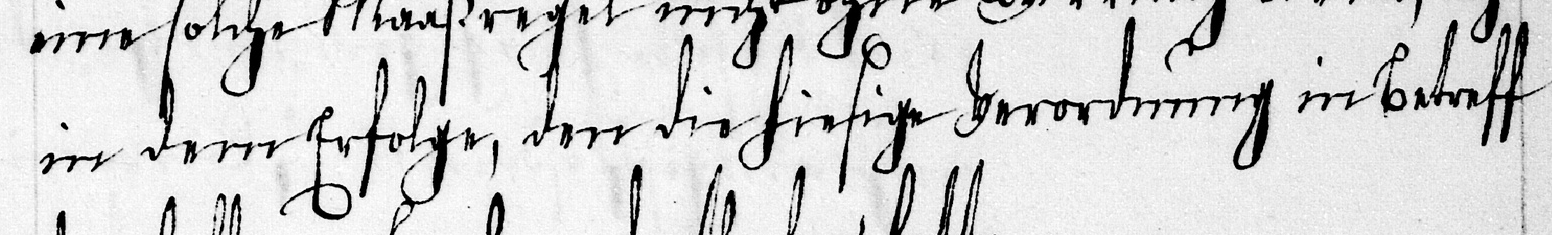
in dem Erfolge, den die hiesige Verordnung in Betreff
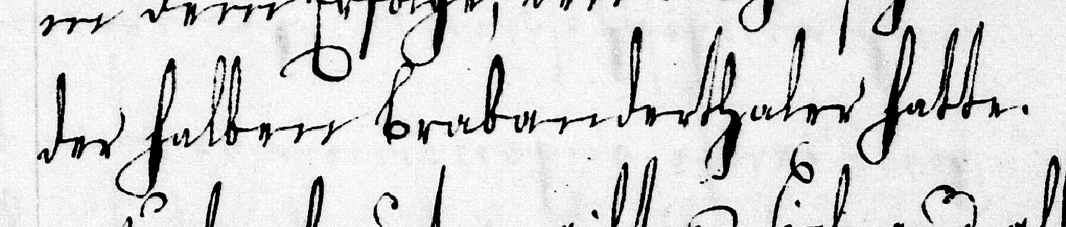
der halben Brabanderthaler hatte.
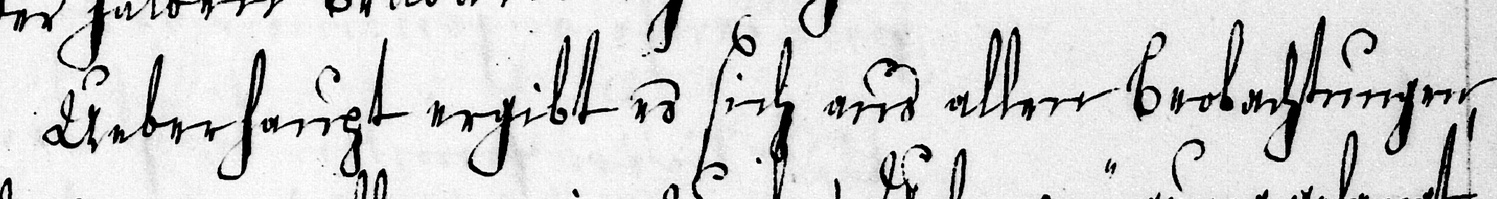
Ueberhaupt ergibt es sich aus allen Beobachtungen,
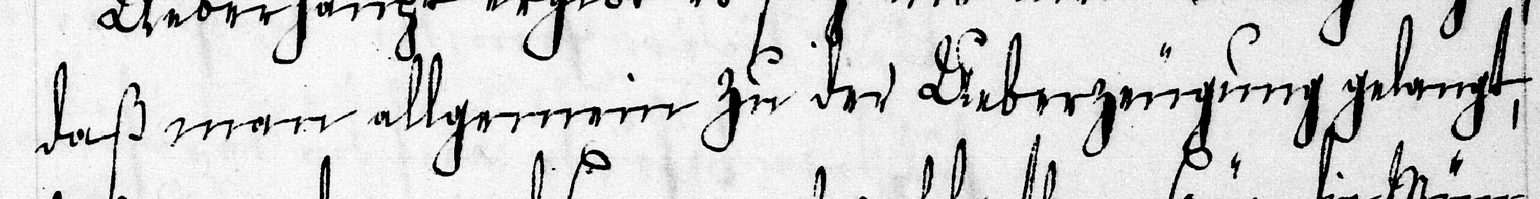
daß man allgemein zu der Ueberzeugung gelangt,
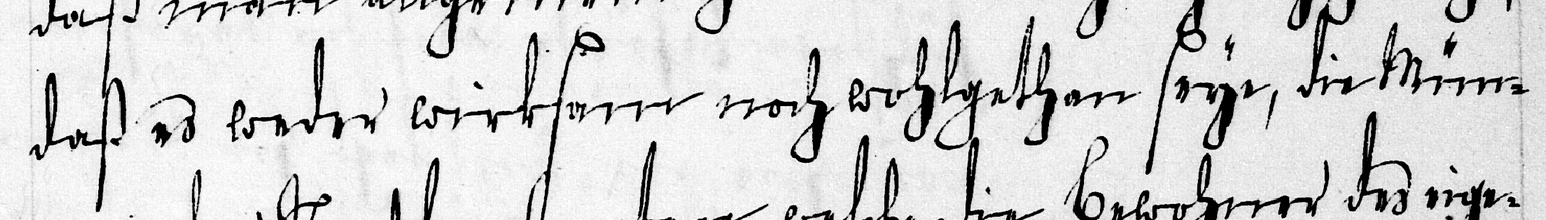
daß es weder wirksam noch wohlgethan seye, die Mün¬
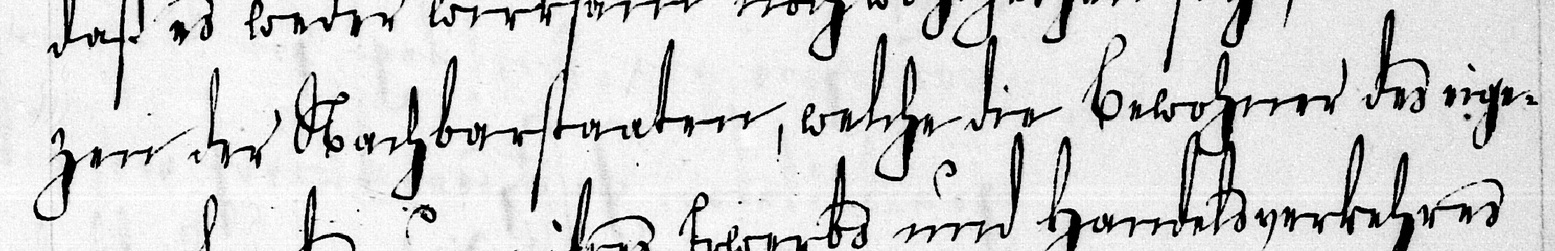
zen der Nachbarstaaten, welche die Bewohner des eige¬
